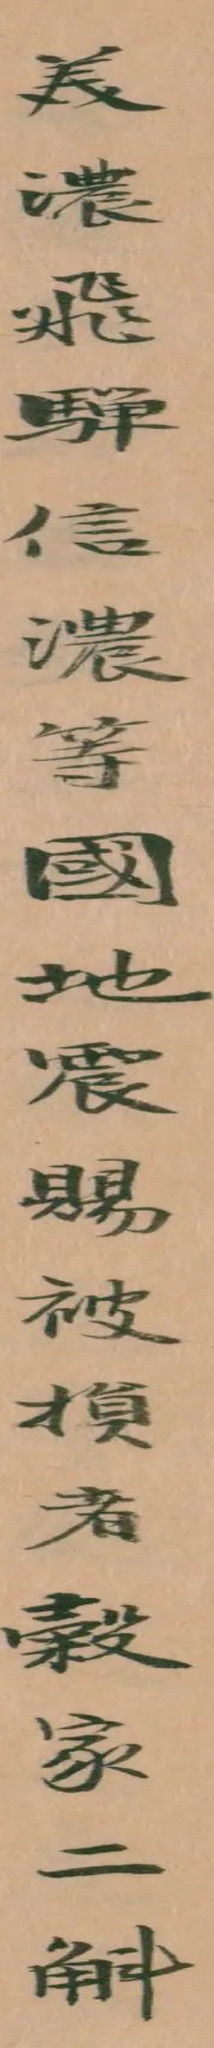美濃飛騨信濃等国地震賜被損者穀家二斛
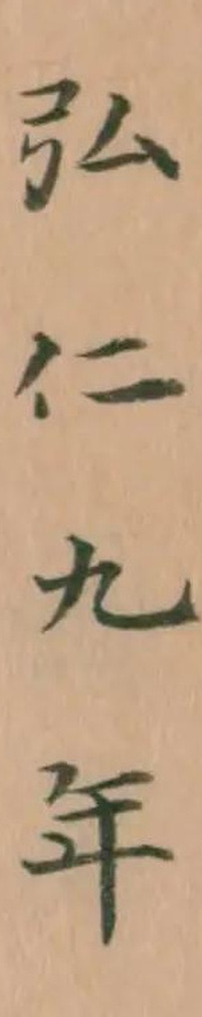弘仁九年
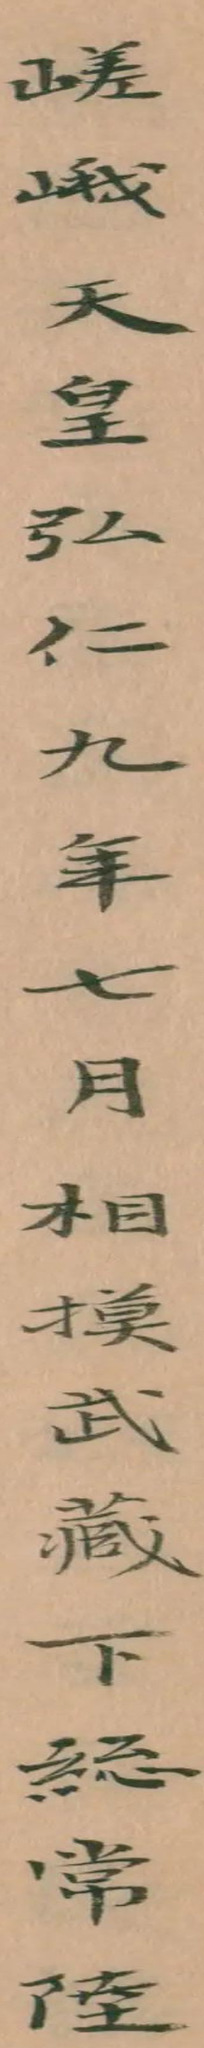嵯峨天皇弘仁九年七月相模武蔵下総常陸
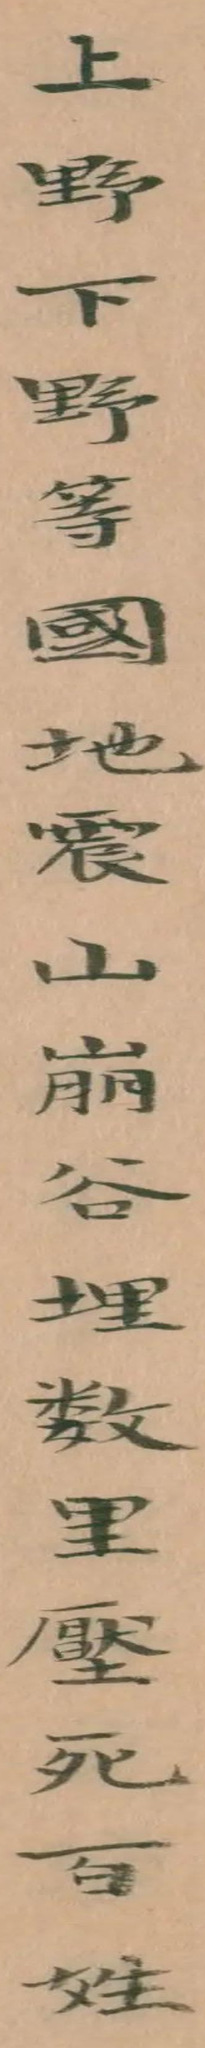上野下野等国地震山崩谷埋数里圧死百姓
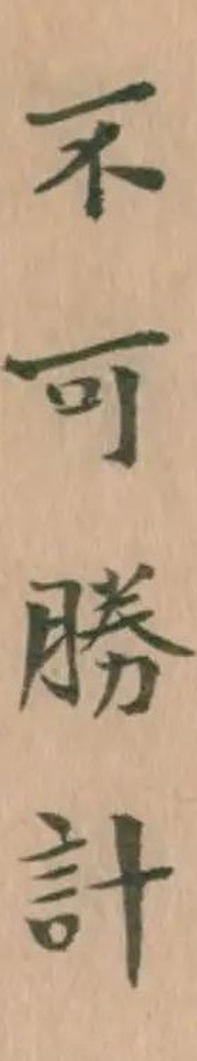不可勝計
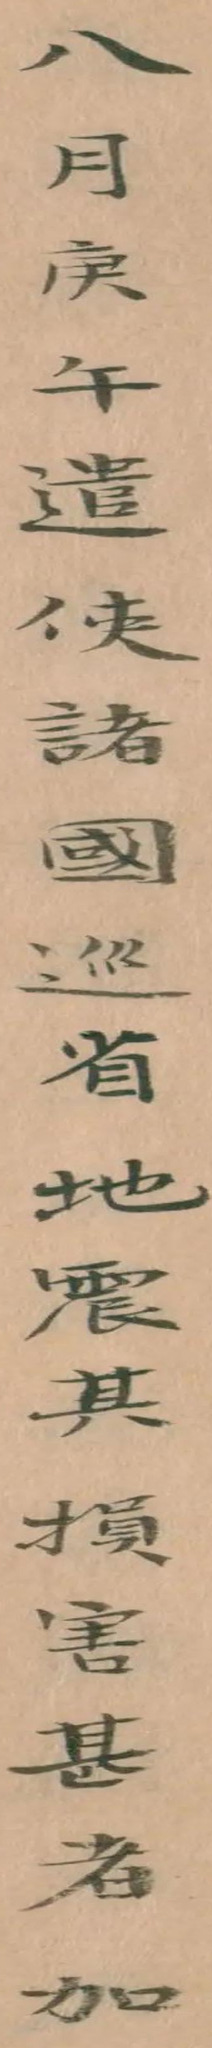八月庚午遣使諸国巡省地震其損害甚者加
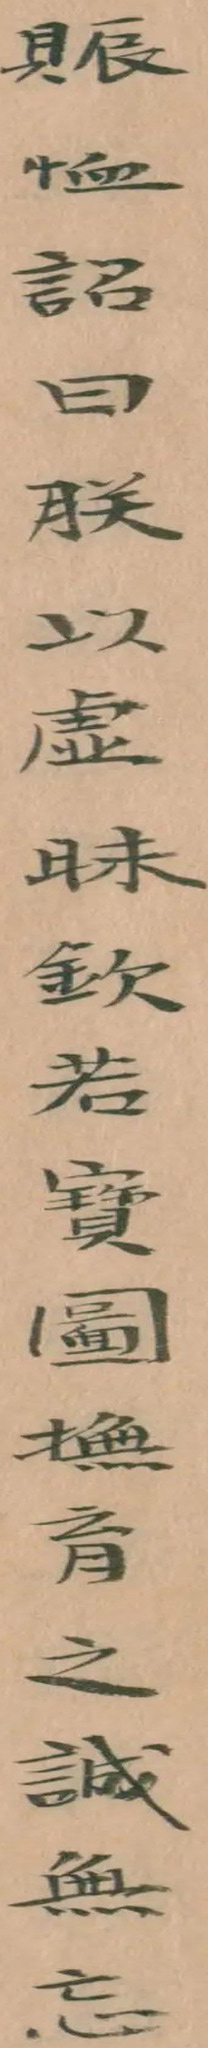賑恤詔曰朕以虚昧欽若宝図撫育之誠無忘
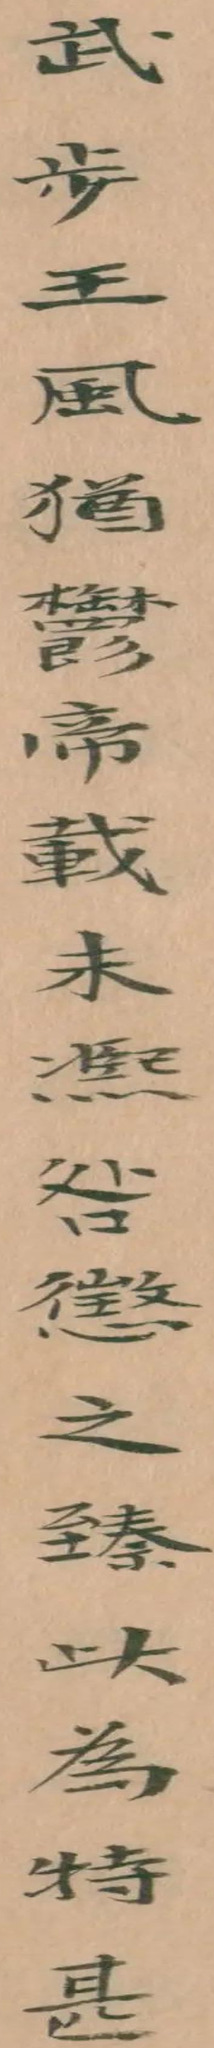武歩王風猶鬱帝戴未熙咎懲之臻此為特甚

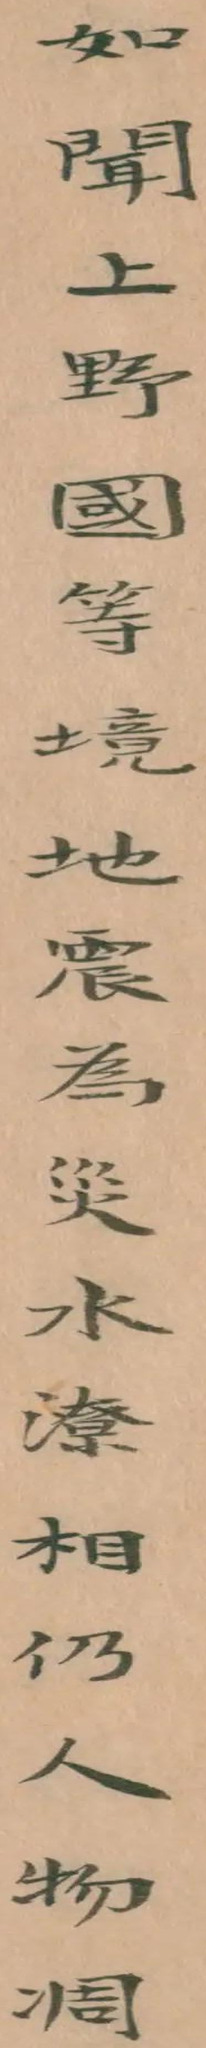如聞上野国等境地震為災水潦相仍人者凋
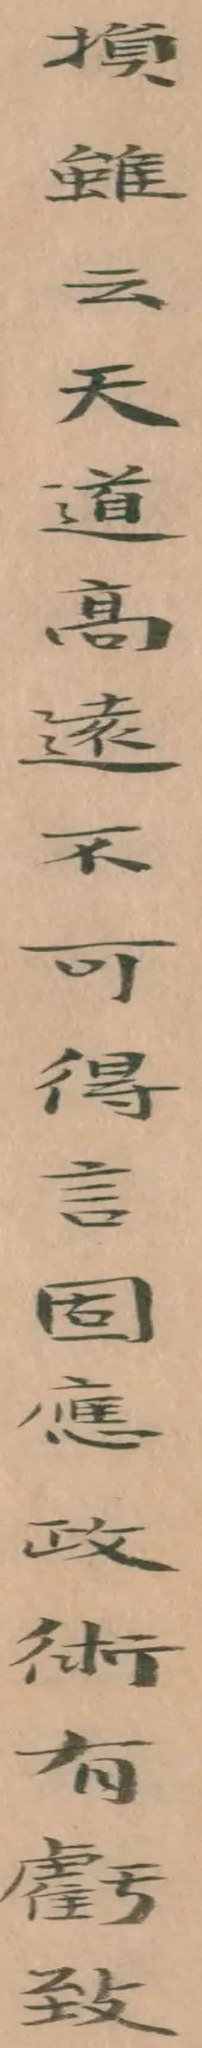損雖云天道高遠不可得言固応政術有虧致
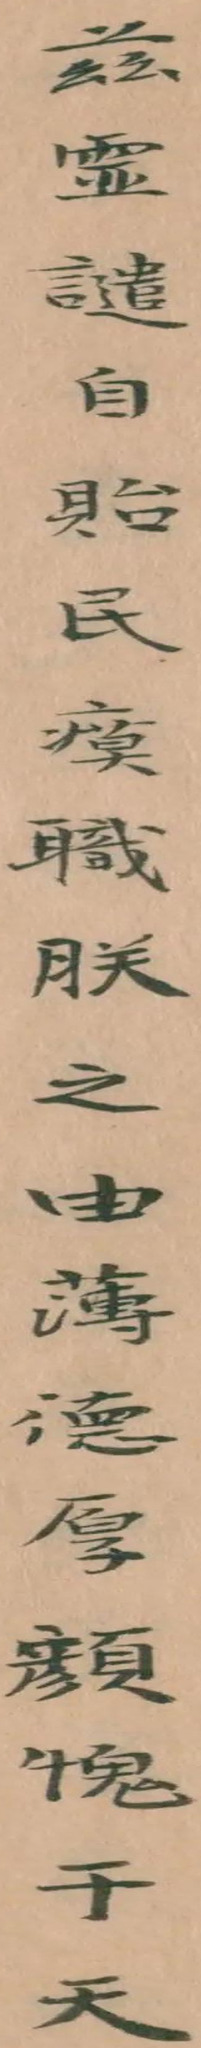茲霊譴自貽民瘼職朕之由薄徳厚顔愧于天
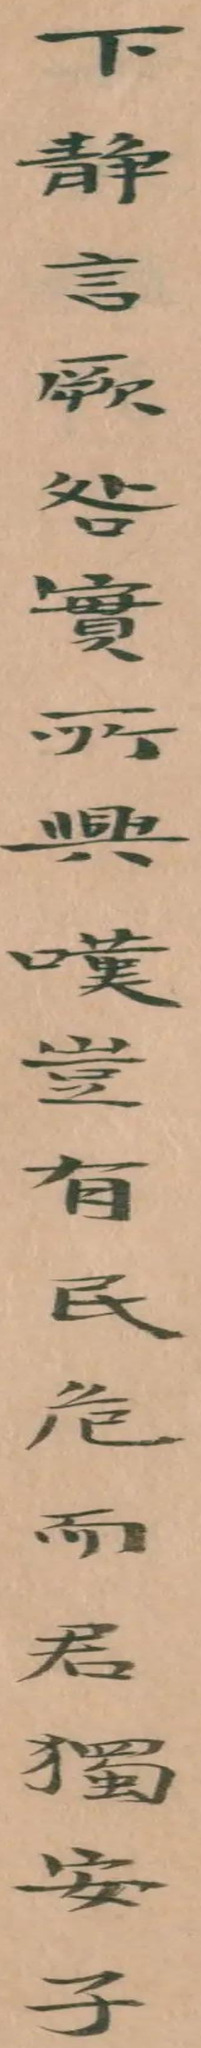下静言厥咎実所興嘆豈有民危而君独安子
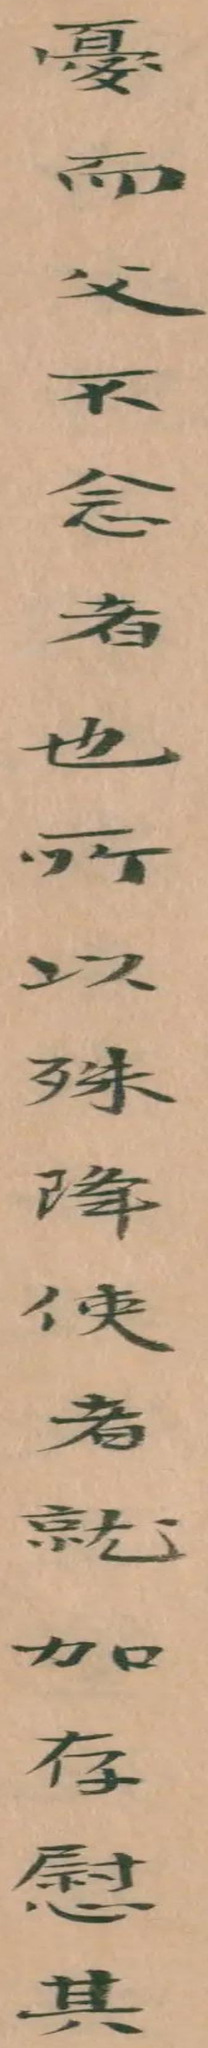憂而父不念者也所以殊降使者就加存慰其
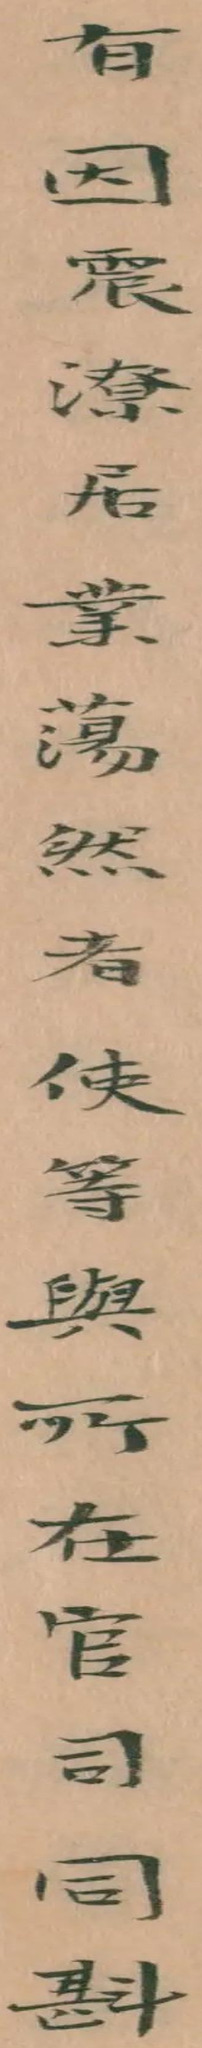有因震潦居業蕩然者使等與所在官司同斟
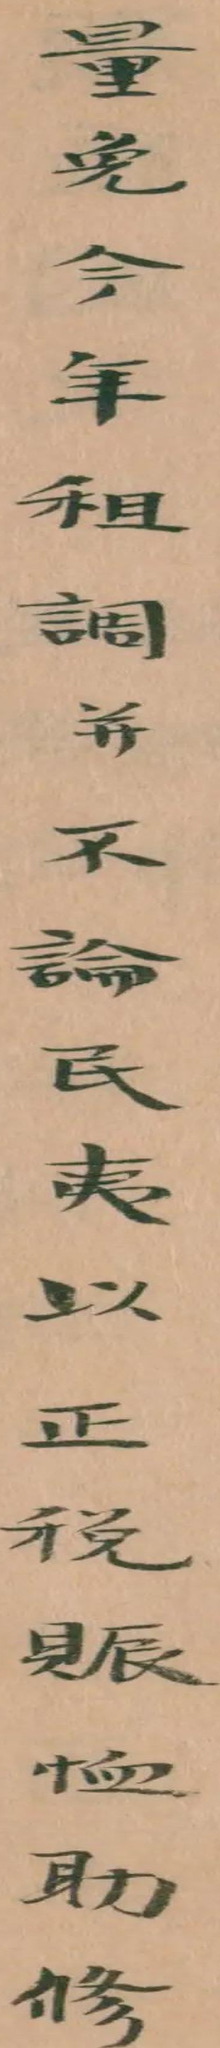量免今年租調幷不論民夷以正税賑恤助修
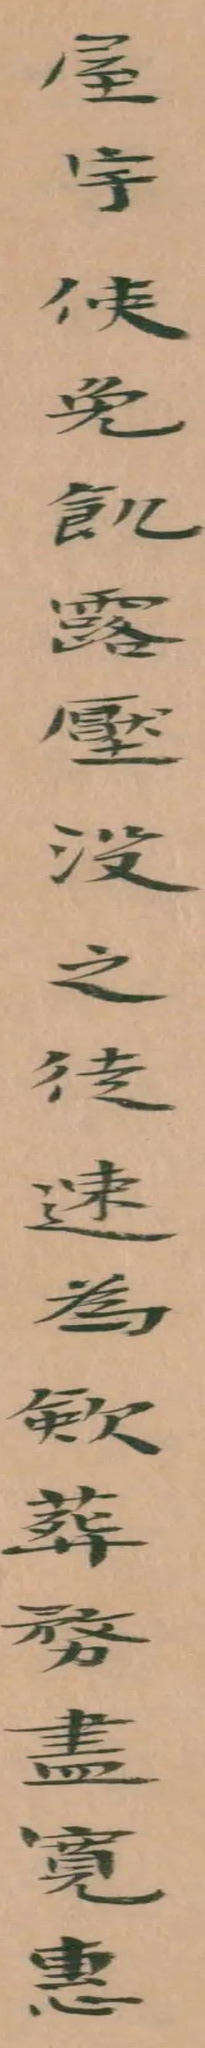屋宇使免飢露圧没之徒速為斂葬務尽寛恵
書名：地災撮要. 巻5-6(地震之部)
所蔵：国立国会図書館 National Diet Library, JAPAN
